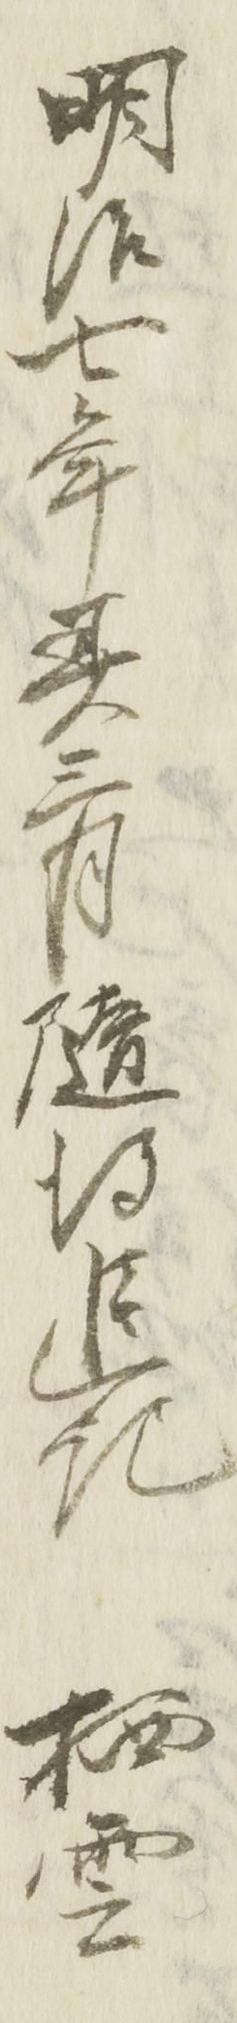明治七年春三月随得追記栖雲

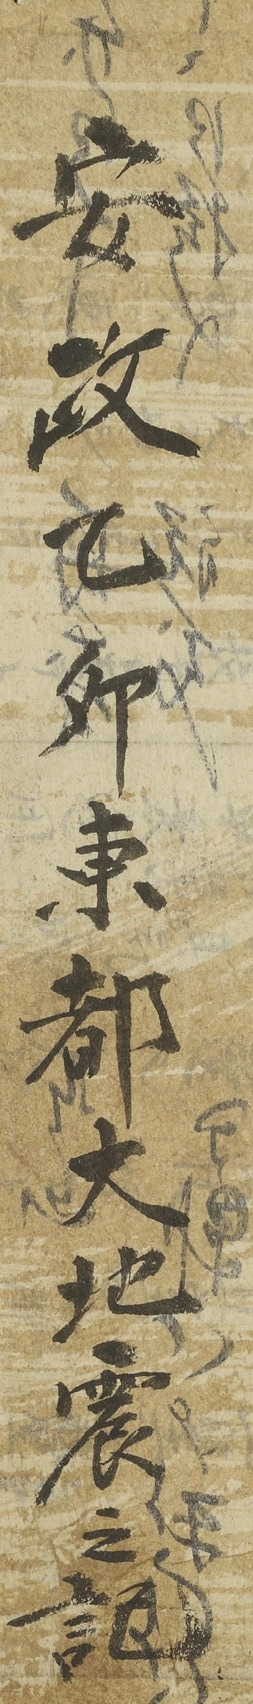安政乙卯東都大地震之記

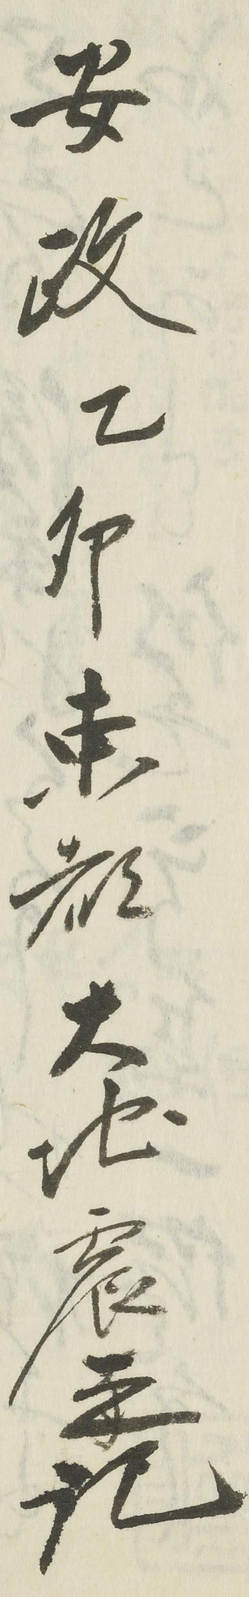安政乙卯東都大地震之記

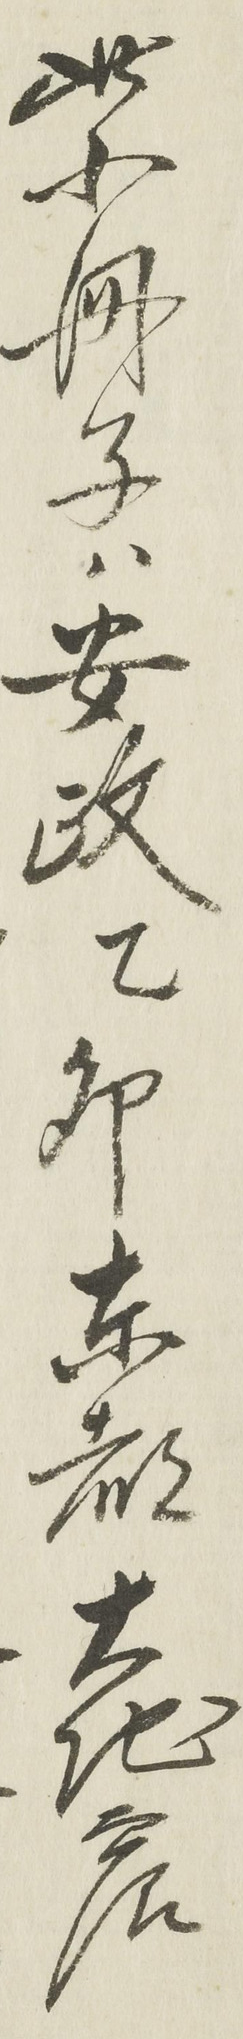此小冊子は安政乙卯東都大地震
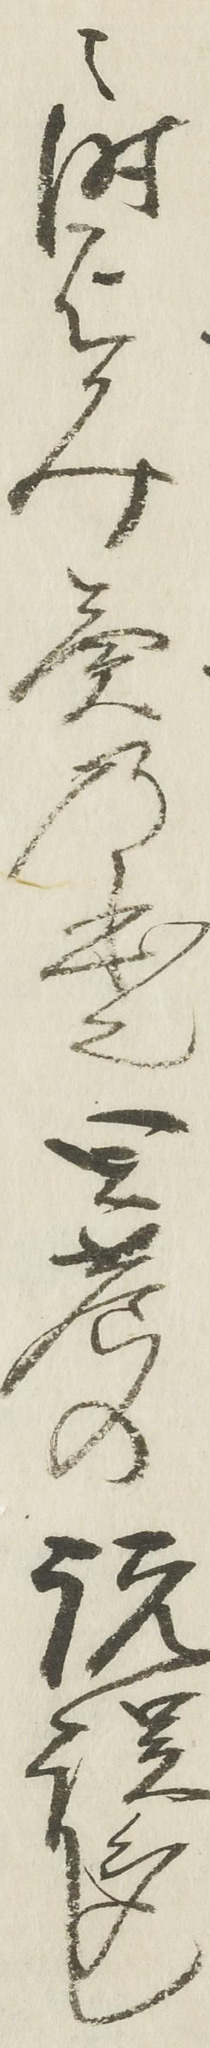之時よみ売の本也里巷の説誤多し
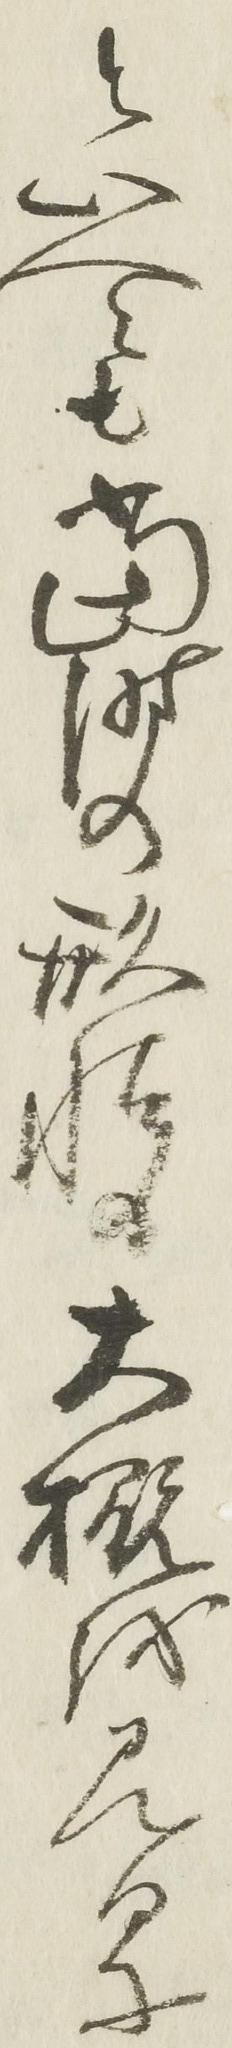といへとも当時の形情の大概を見るに
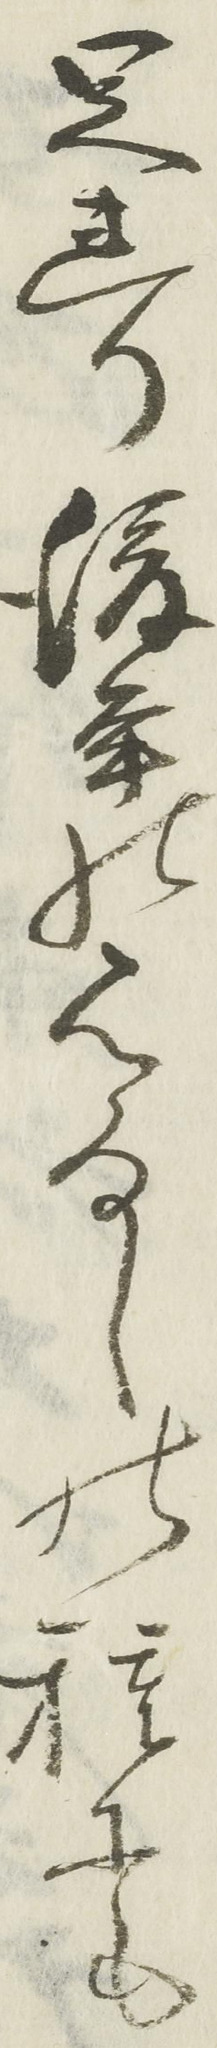足れり後年のはなしの種にも
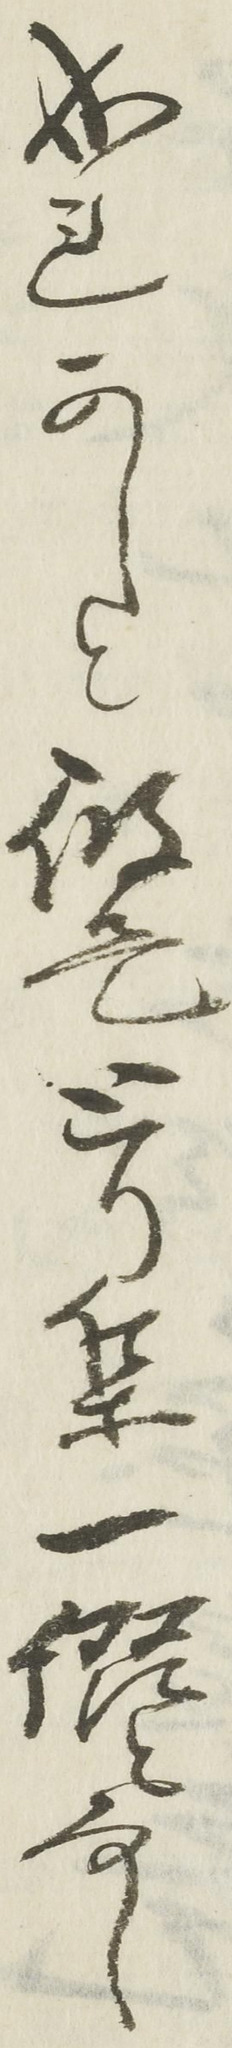成れかしと彼是とり集一綴となし
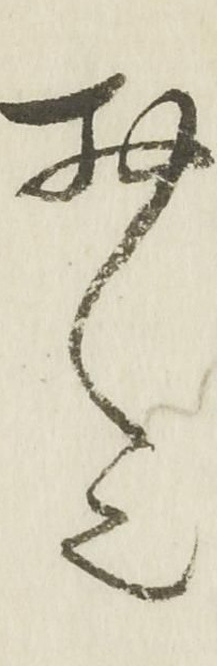おく也
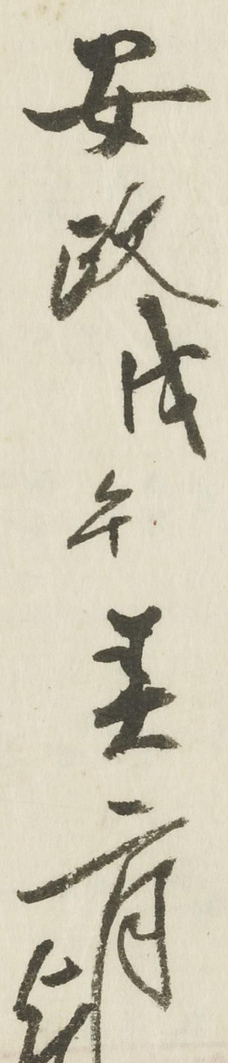安政戊午春二月

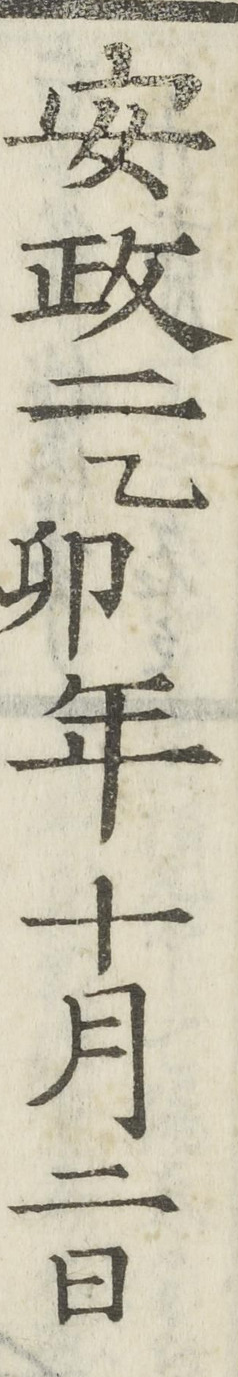安政二乙卯年十月二日
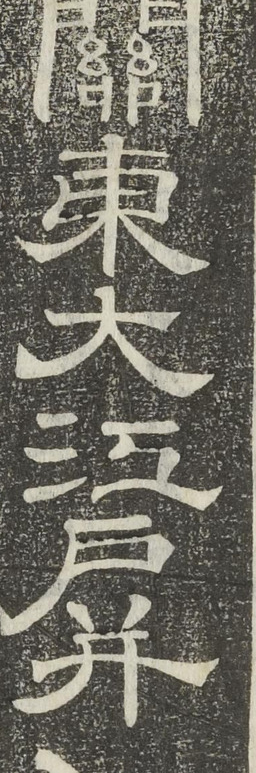関東大江戸并
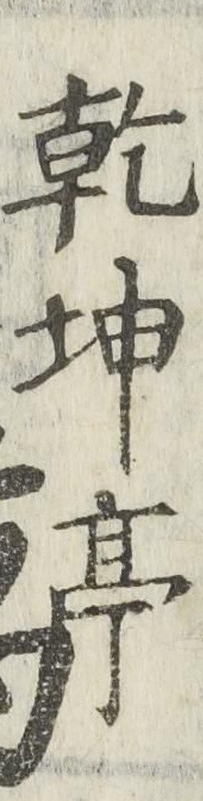乾坤亭

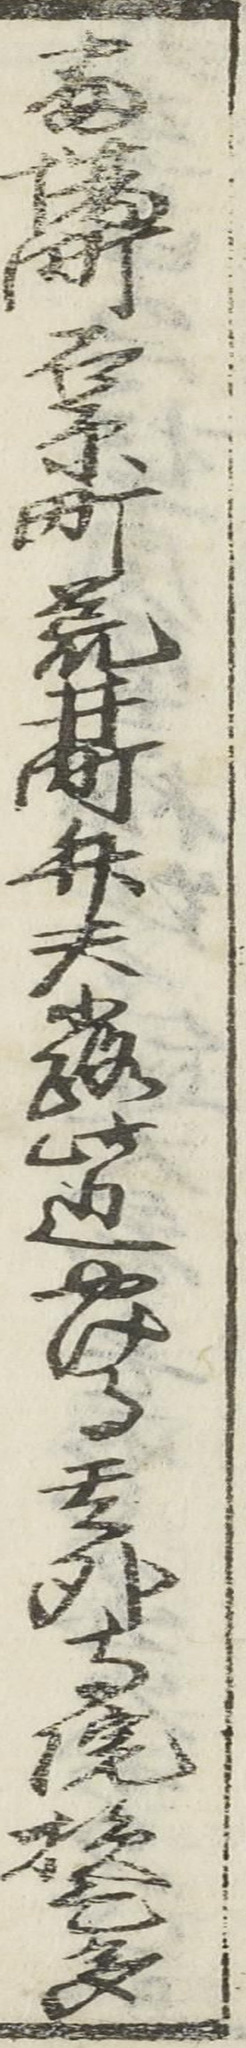冨場町石原町荒井町弁天小路此辺やける其外寺院損亡多
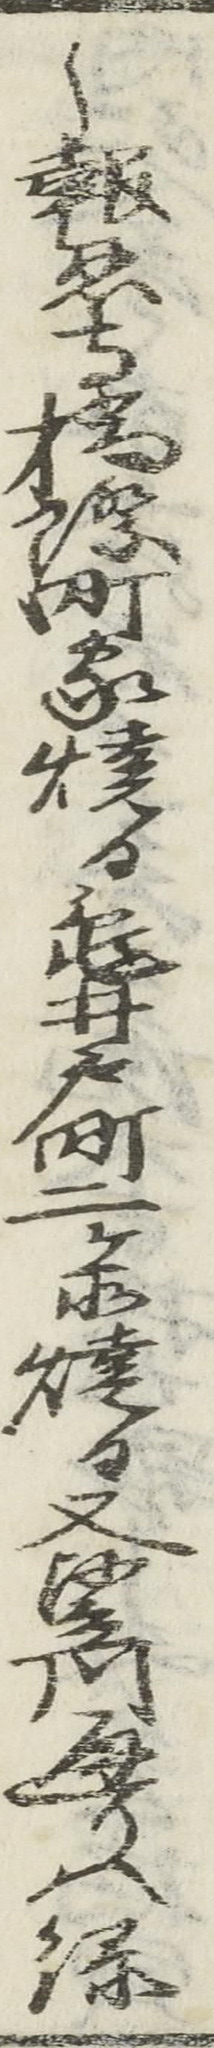し報恩寺橋豫町家焼る亀井戸町二ケ所焼る又竪川通りは緑
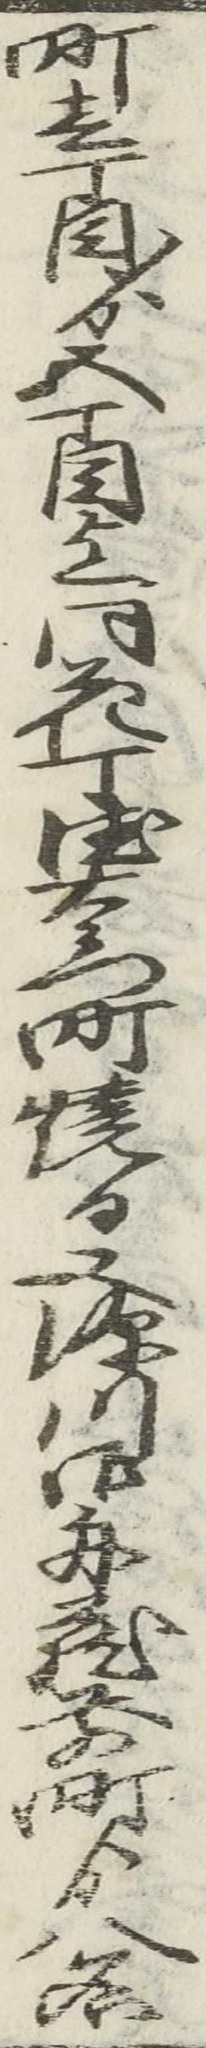町壱丁目ゟ五丁目迄同花丁庄右衛門町焼る又深川御舟蔵前町ゟ八名
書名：安政乙卯江戸大地震筆記　安政丙辰八月大阪大雷雨之記追加　安政三辰年七月松前辺大地震并八月大風雨記録
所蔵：東京大学地震研究所図書室 Earthquake Research Institute Library, The University of Tokyo, JAPAN
